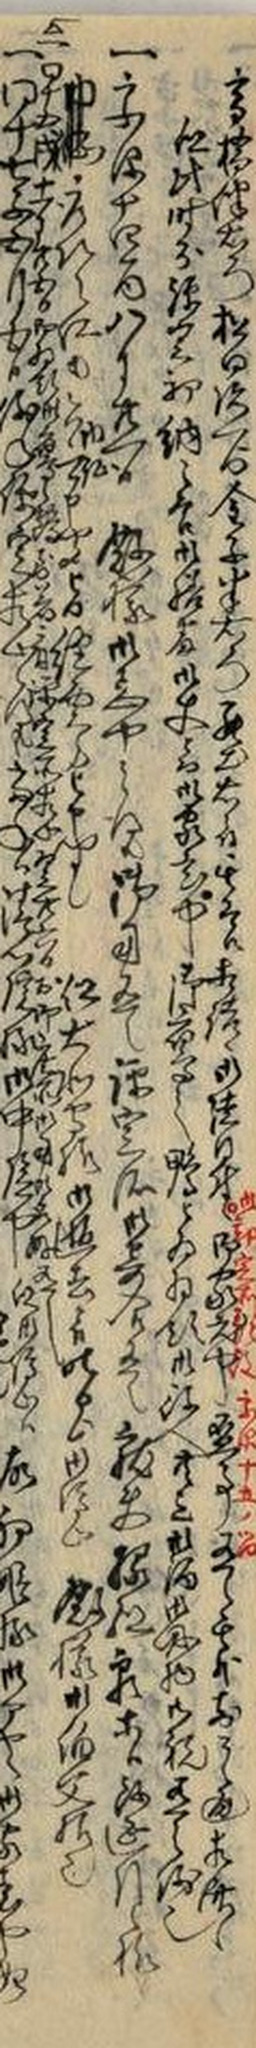一享保十四酉八月廿一日殿様御忌中に候得共御用有之評定所御寄合有之就夫縁組願等は致延引候様
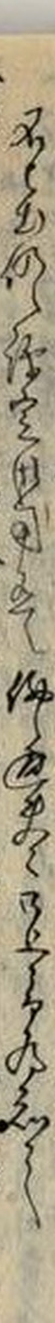不被出仍之評定御用有之例之通夫々口上にて為知之
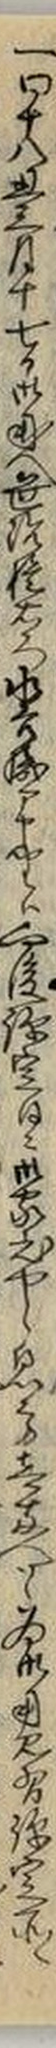一同十八丑三月十七日御用人笹治権右衛門水谷織部申聞候は向後評定日に御家老中之息方壱両人ツヽ為御用見習評定所へ
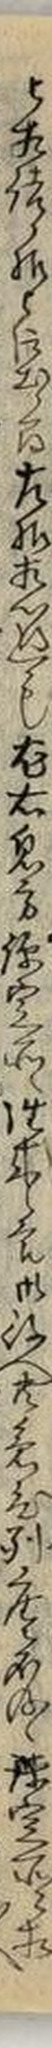被相詰候様被仰出候間左様相心得可申候尤右息方評定所へ往来之節御役人共急度列座に不及候評定所に相
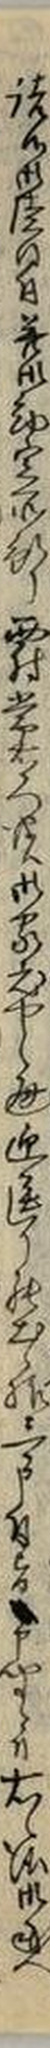詰候御徒目付并御勘定所預り西村常右衛門儀は御家老中之通迎送り罷出候様に可申付旨申聞候に付右之趣御承人
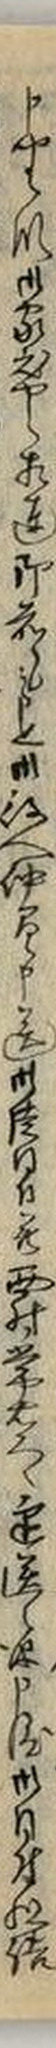申聞候段御家老中へ相達御前へも申上御役人仲間へ申送御徒目付并西村常右衛門へ迎送之儀申渡御目付組詰
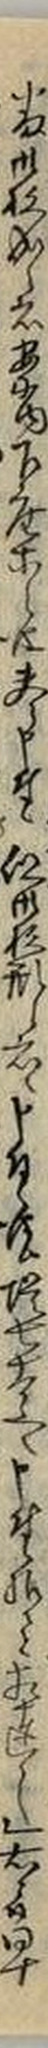番御杉成之者案内下座等之儀夫々申付候但御杉形之者へ申付候儀は堤七大夫へ申付候様にと相達之」右に付同十
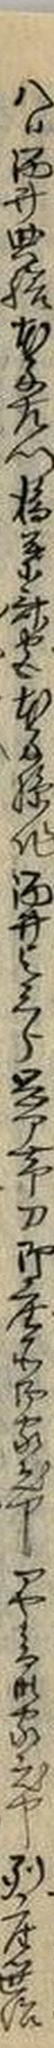八日酒井典膳本多左門稲葉斎宮本多孫作酒井与三郎岡部帯刀御座所御家老中部やにて御家老中列座笹治
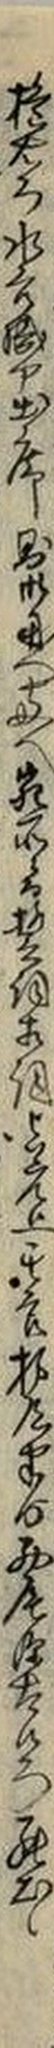権右衛門水谷織部出席則御用人両人宛所にて誓詞相調被差上其節杤屋半右衛門西尾源太左衛門罷出候
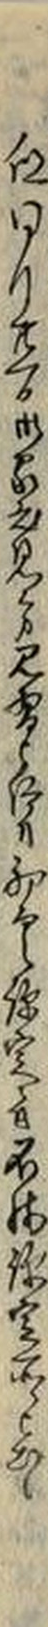但同月廿一日御家老息方見習被仰付初て之評定に付不残評定所へ被出候
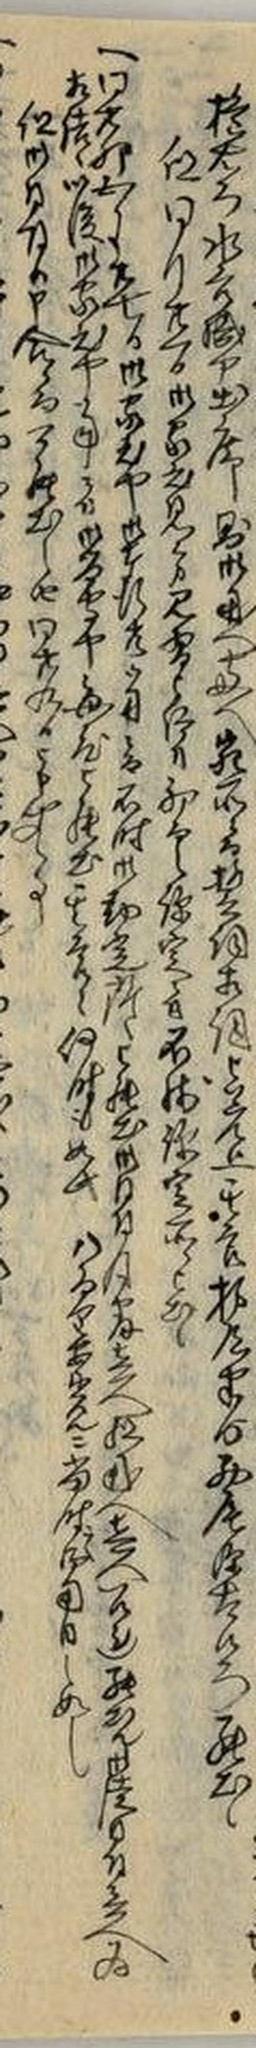一同廿卯五月廿七日御家老中御奉行共御用にて不時御勘定所へ被罷出御目付月番壱人組用人壱人召連罷出ル御徒目付壱人為
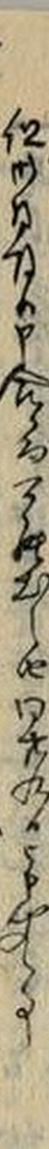但御目付は申合候て可罷出之由同廿九日被申聞候事
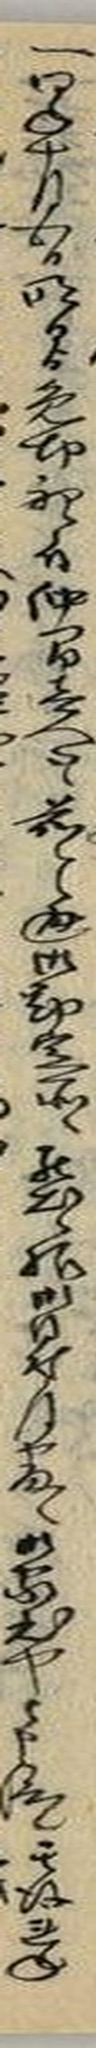一同年十月五日明日ゟ免切初候に付仲間壱人ツヽ前々之通御勘定所へ罷出候様御目付月番へ御家老中被申渡候其後連年如此
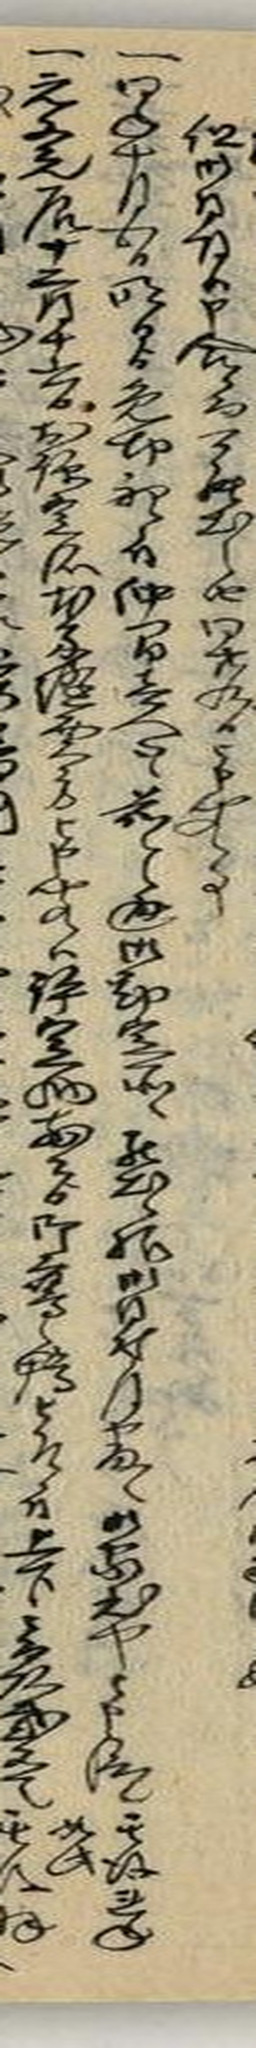一元文元辰十二月十六日於評定所本多縫殿方被申聞候は評定納前々ゟ御鷹之鴨被下候に付上下にて頂戴有之其後羽
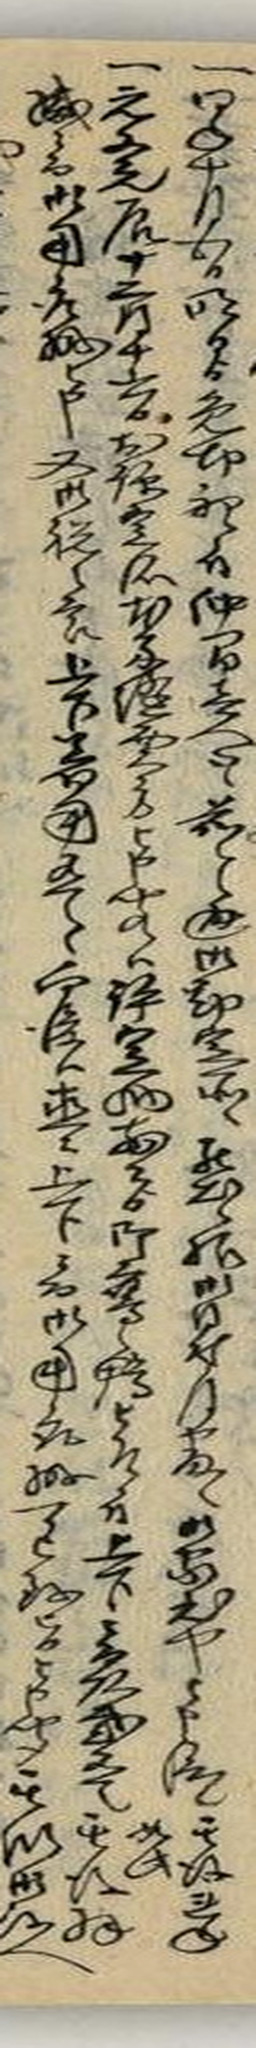織にて御用取扱被申又御祝之節上下着用有之候向後は直に上下にて御用取扱可被致旨被申聞其段御役人
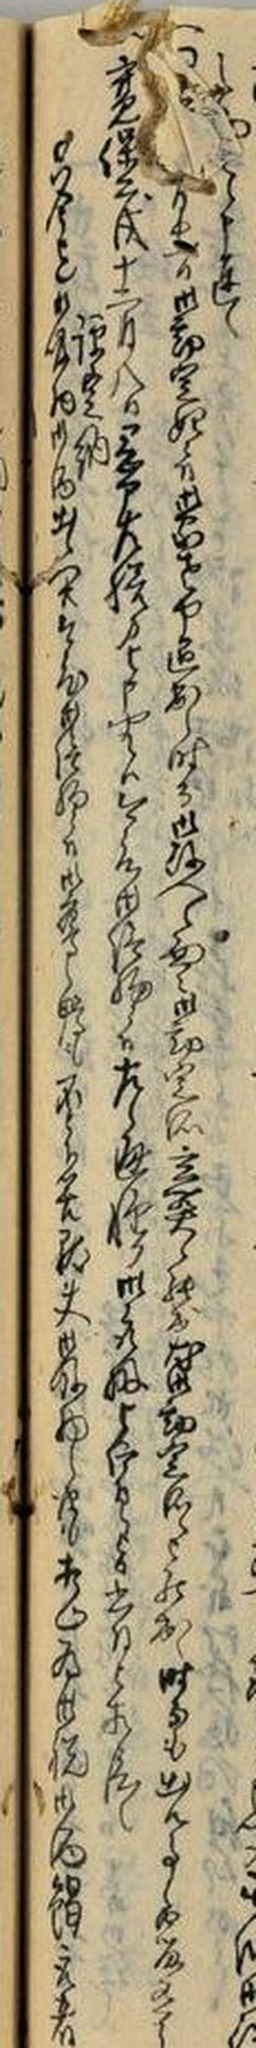一寛保二戌十二月八日岡部左膳方被申聞候は今度御倹約に付左之通軽ク御取扱被仰付候旨書付被相渡候
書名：御城下諸事之部
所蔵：福井県文書館 Fukui Prefectural Archives
